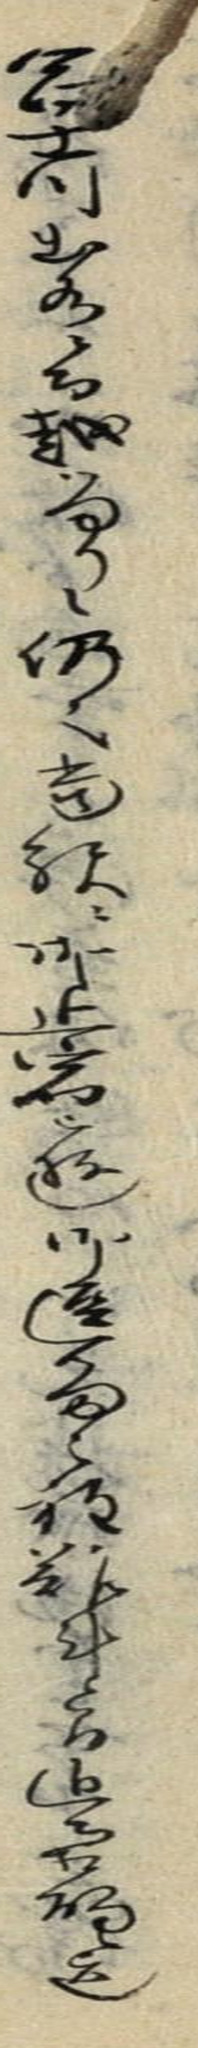富士川出水にて越留り候仍之当駅に御止宿被遊御逗留之程難計候間追て相触候迄
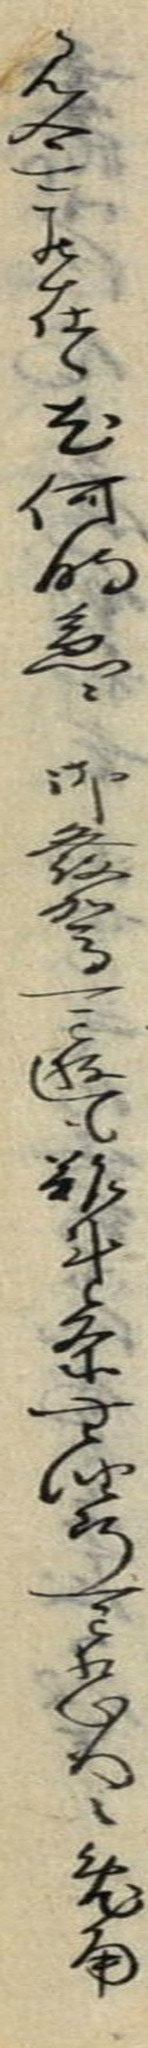見合可罷在仕候尤何時急に御発駕可被遊も難計候条無油断可被相心得候兎角
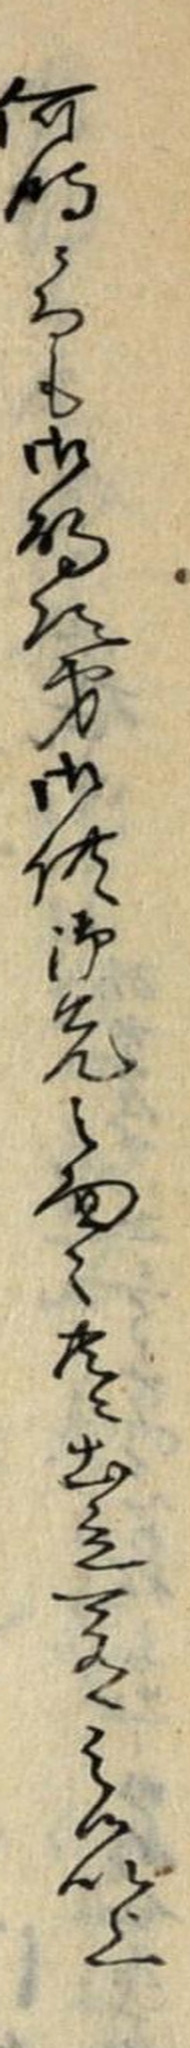何時にても御触次第御供御先之面々共に出立可有之候以上
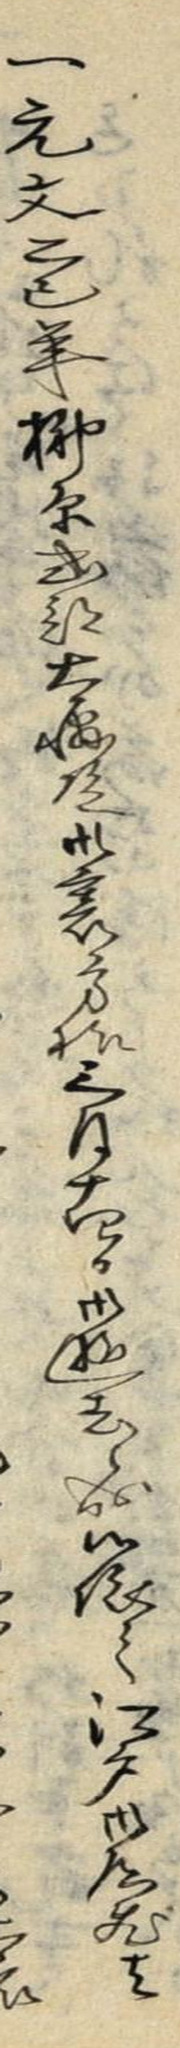一元文二巳年榊原式部大輔殿御裏方様三月十四日御逝去被成候依之江戸御屋敷は
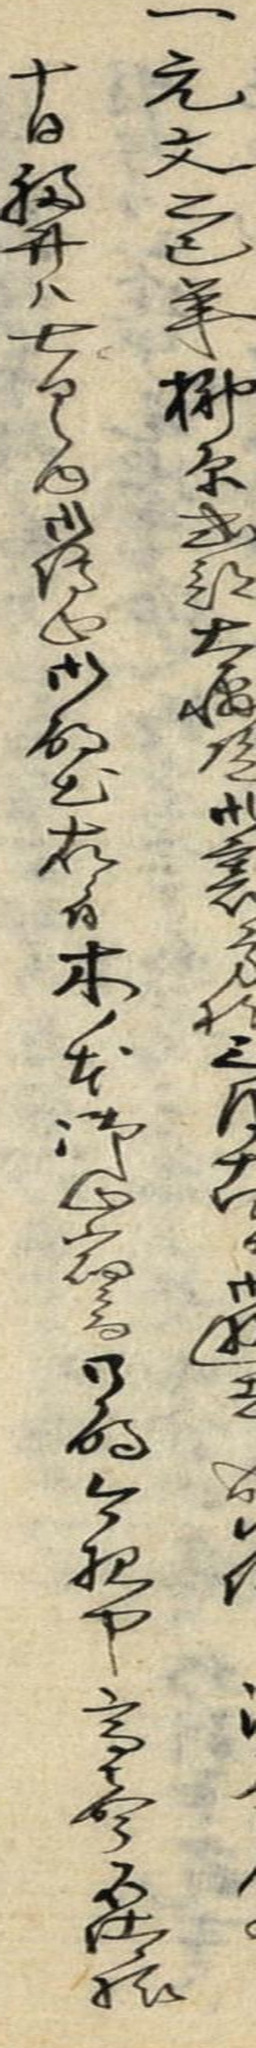十日福井は七日之内御停止御触出右に付木ノ本御止宿にて口触今夜中高声不仕候様
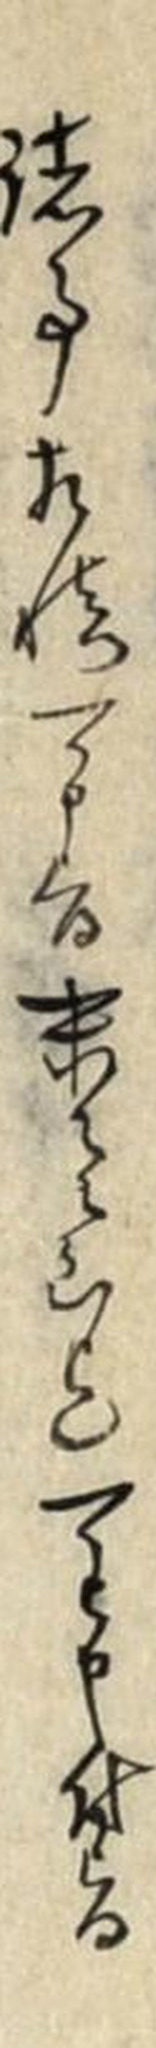諸事相慎可申旨末々に至迄可被申付旨
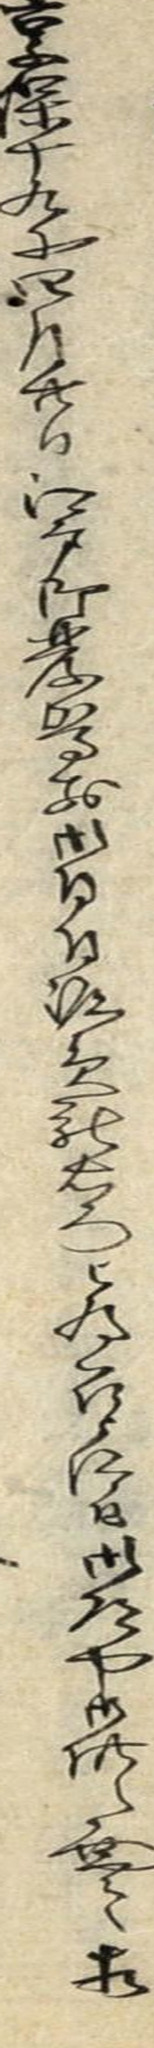一享保十九刁四月廿日江戸御発駕前御目付渥美新右衛門被為召被仰付御道中御供之面々へ相
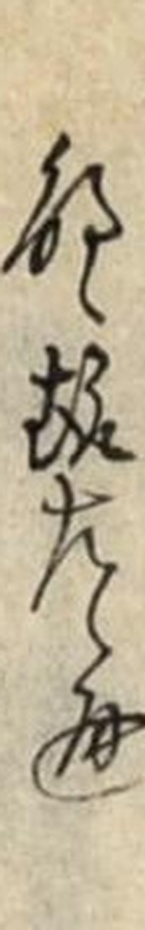触候趣左之通
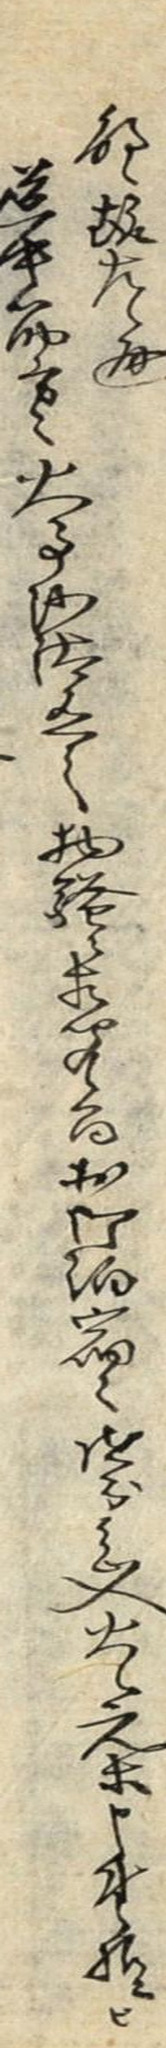道中筋方々火事沙汰有之物騒に相聞候間於御泊宿へ随分念入火之元等申付候様に被
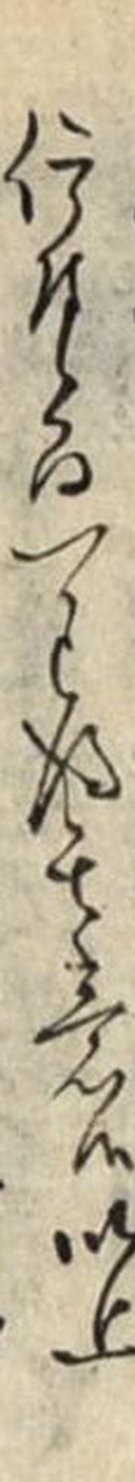仰付候間可被得其意候以上
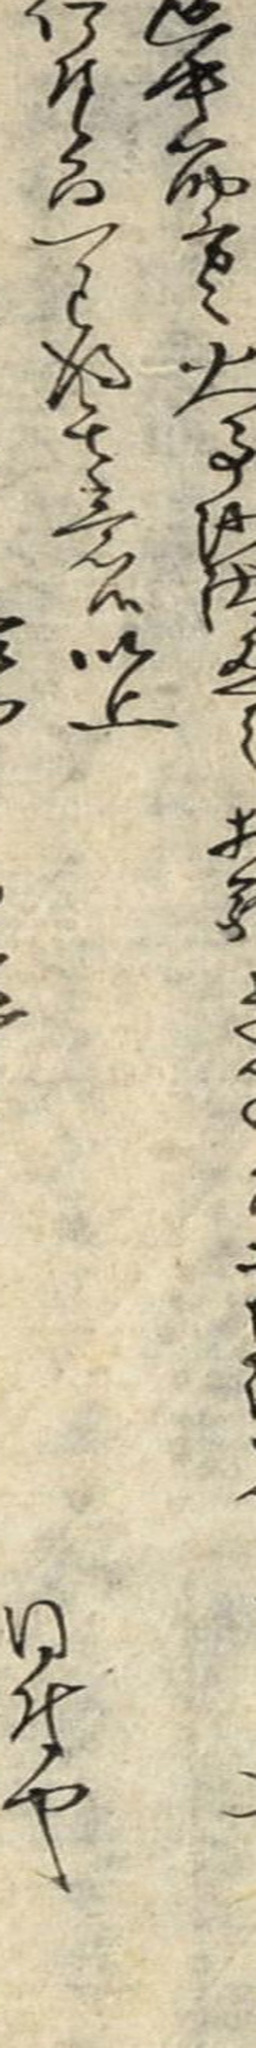仰付候間可被得其意候以上
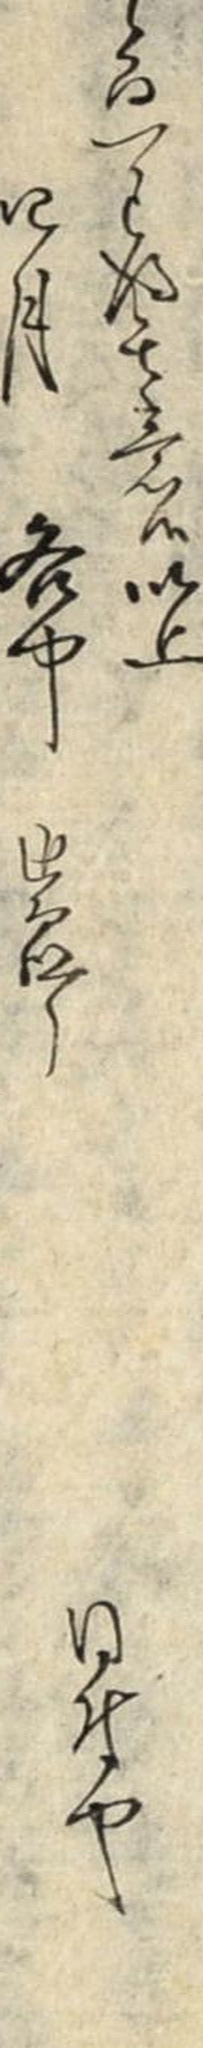四月各中追而組へ目付中
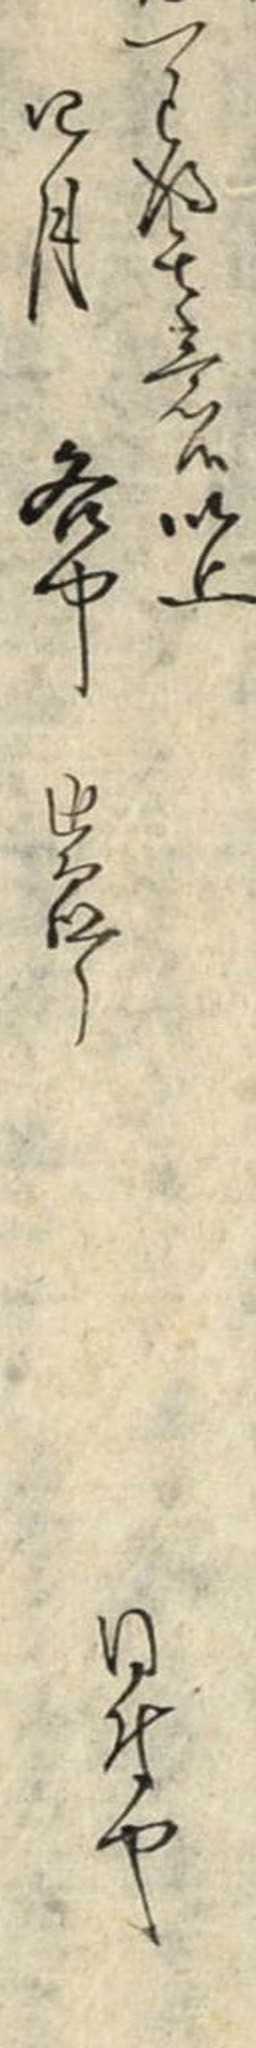四月各中追而組へ目付中
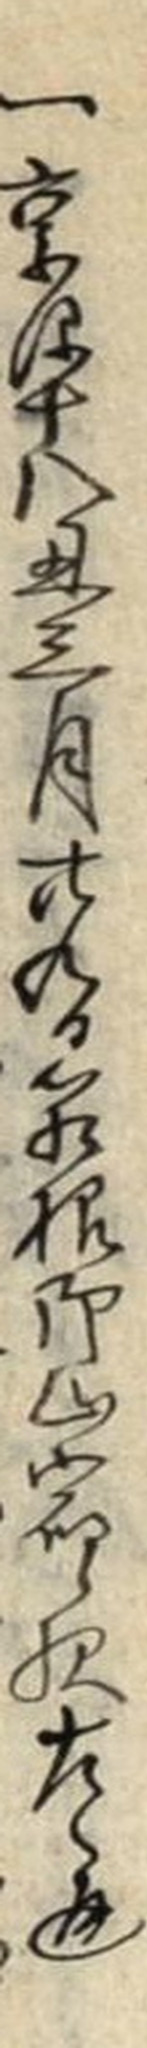一享保十八丑三月廿九日箱根御止宿之夜左之通
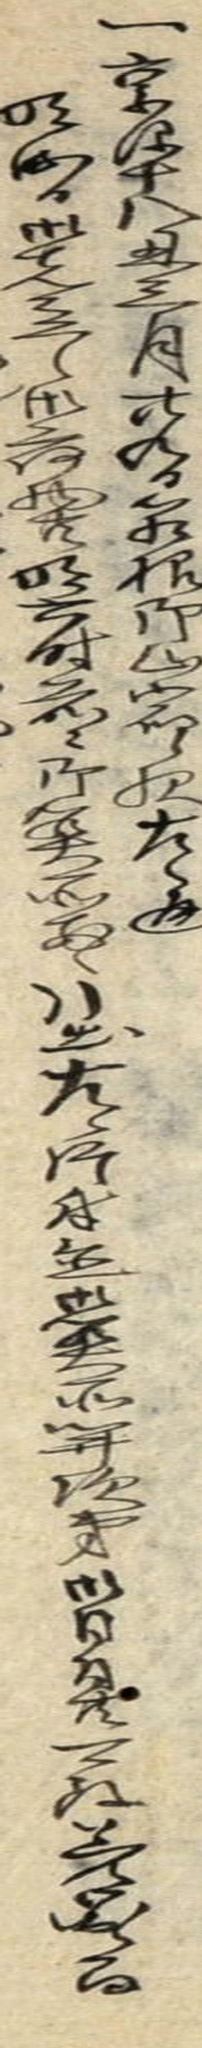明後日御先立之御荷物共明六時前に御関所前へ引出左へ片付置御関所開次第御目付共可致差図候間
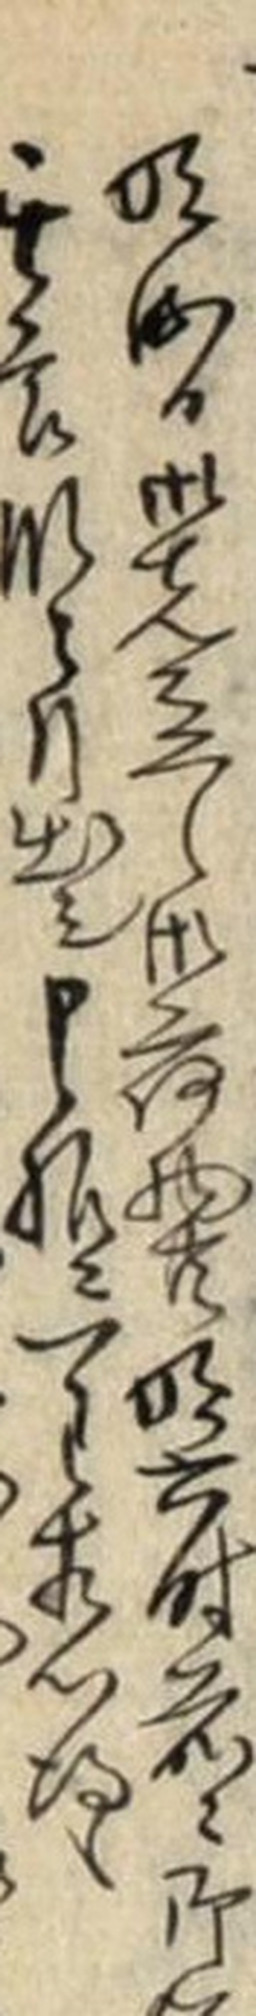其節段々引出し申候様に可被相心得候
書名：三都并道中之部
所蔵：福井県文書館 Fukui Prefectural Archives
